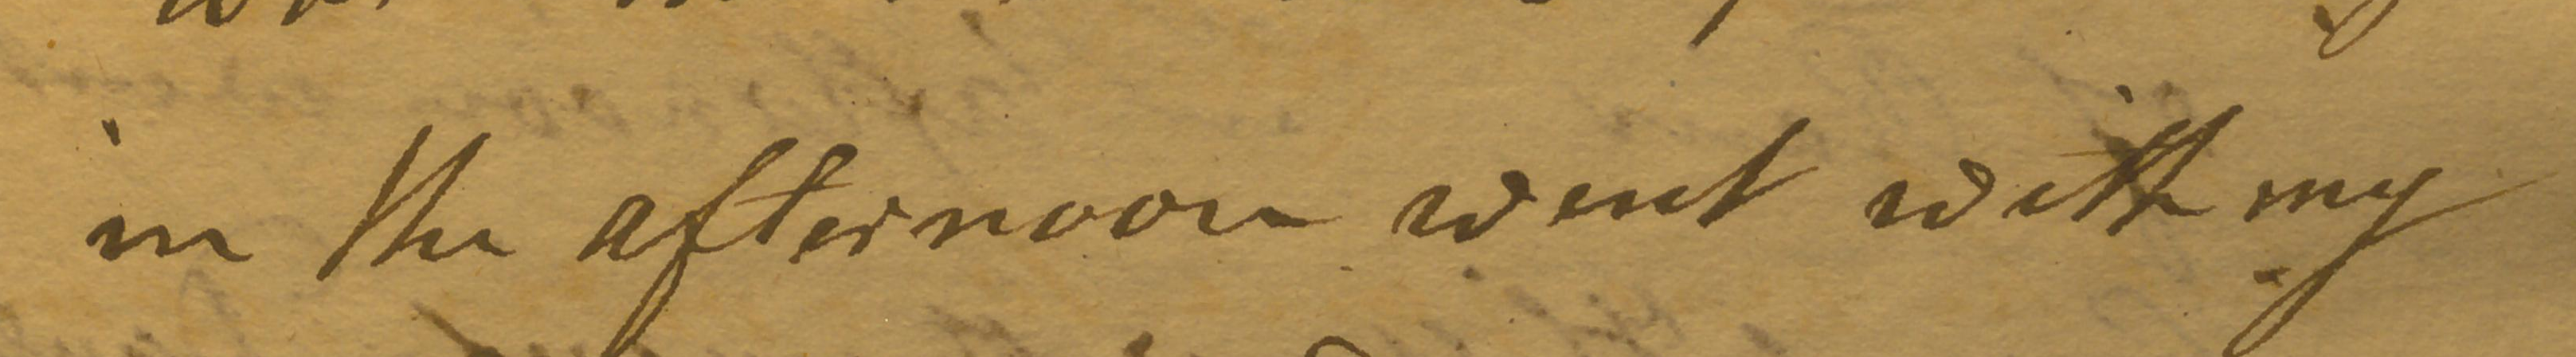in the afternoon went with my
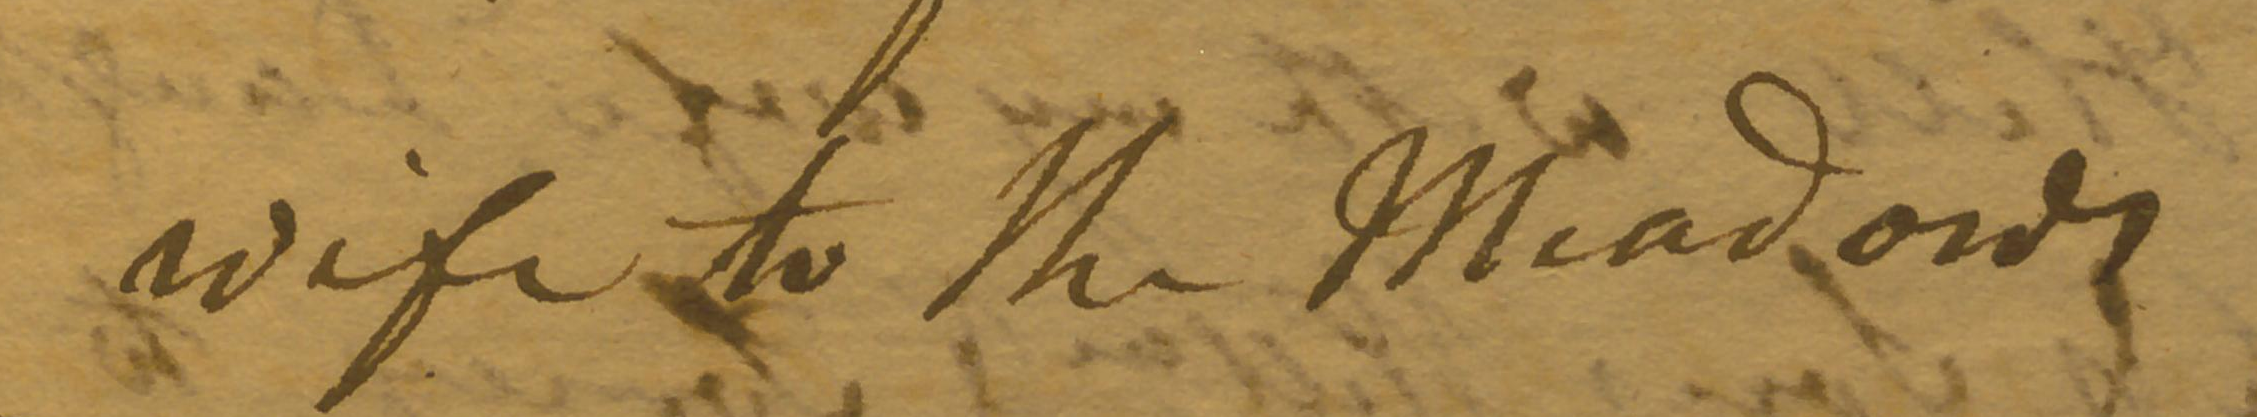wife to the Meadows
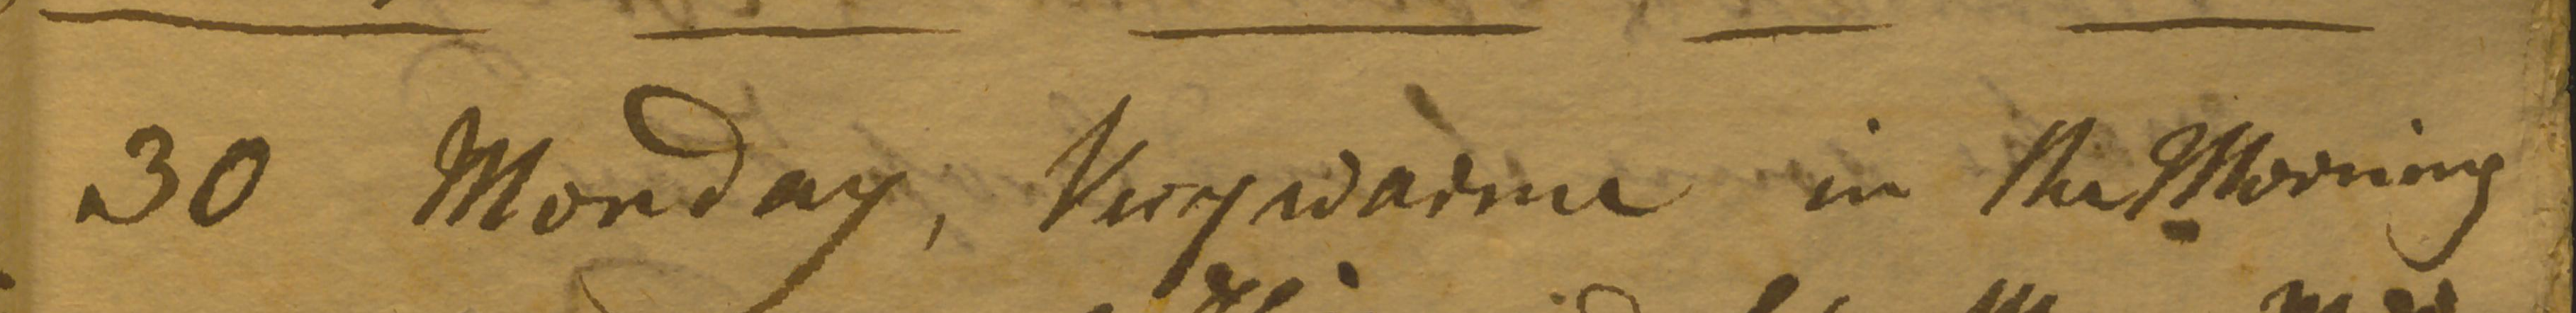30 Monday. Very warme in the Morning
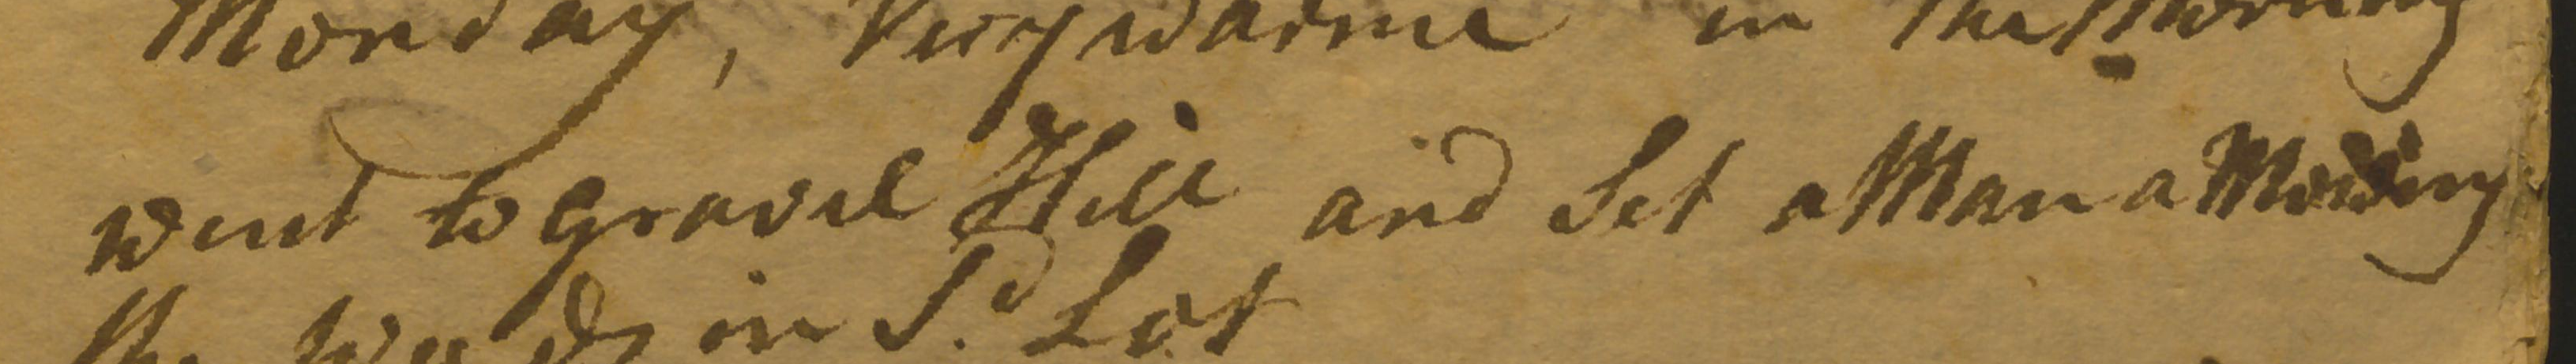went togravel Hill and Set a Man a Mowing
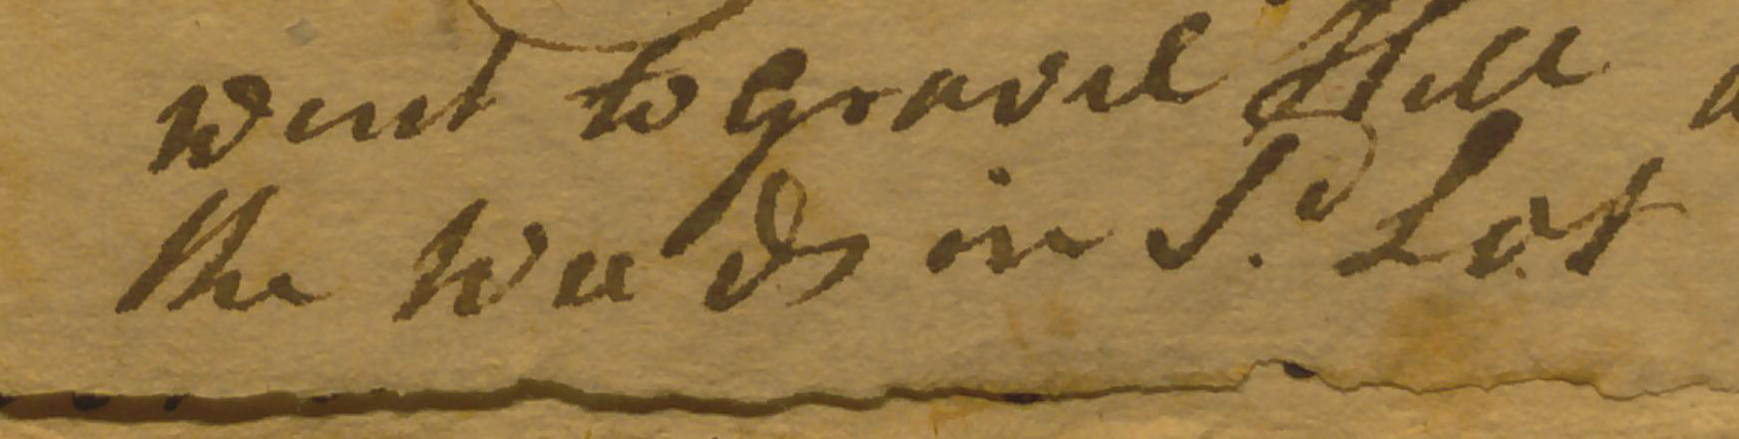the Weeds on s^t. Lot
